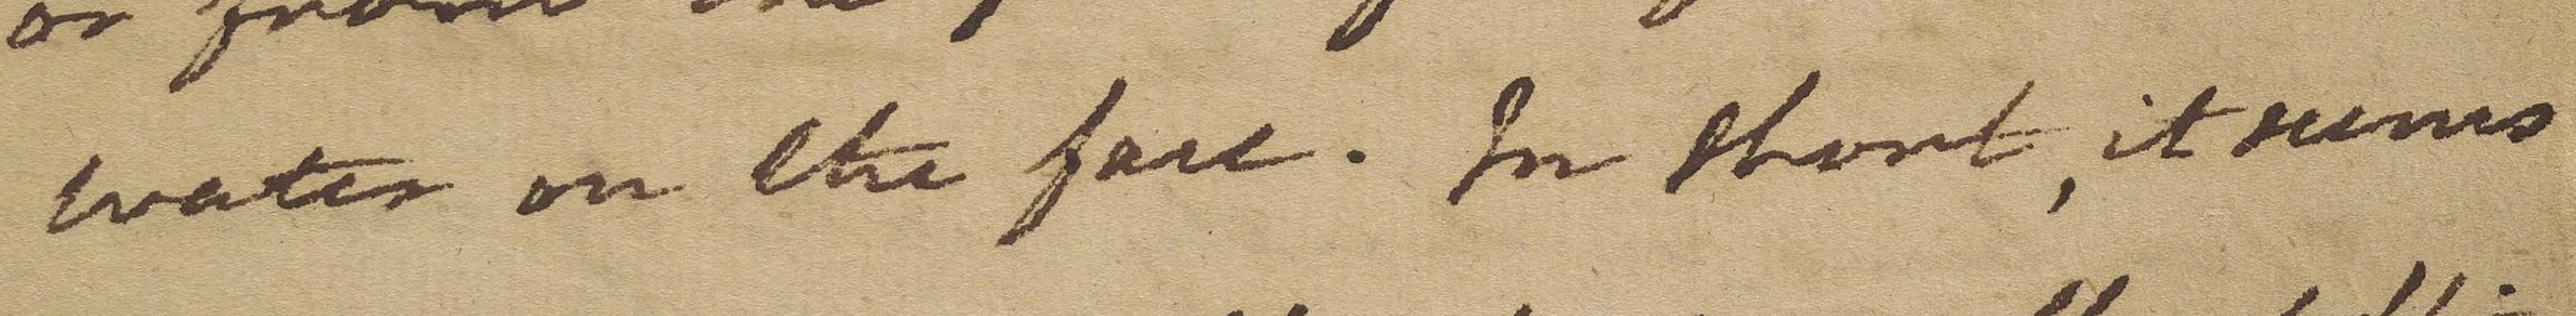water on the face. In short, it seems
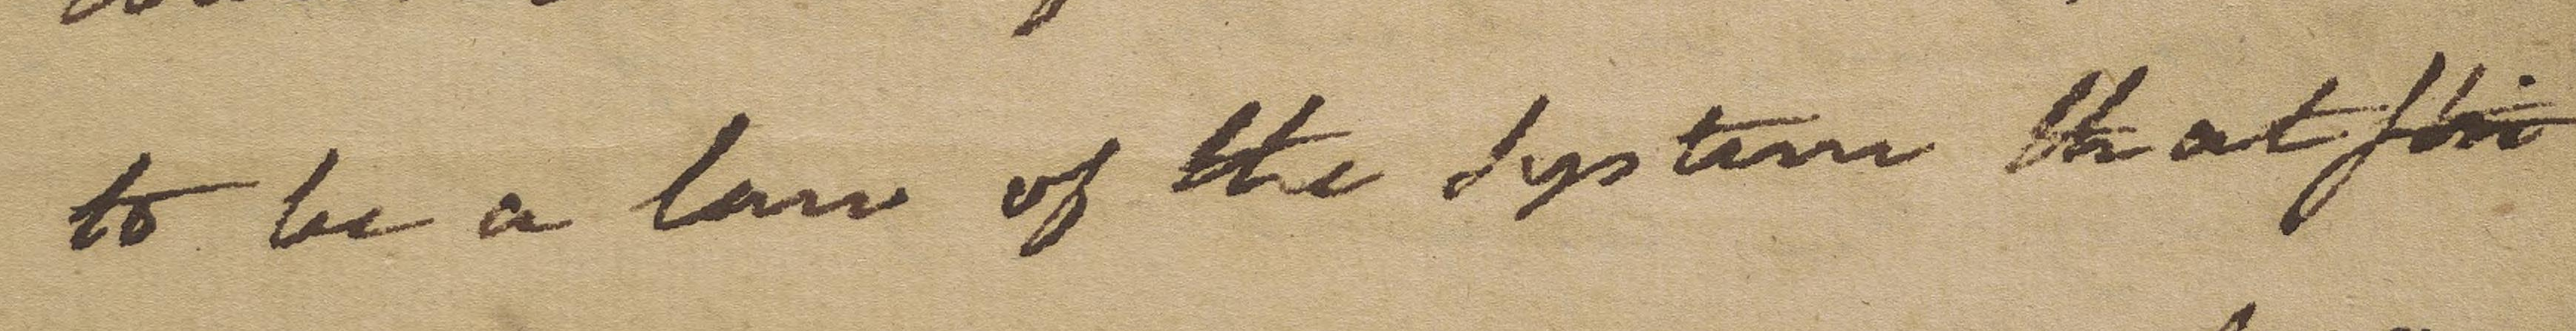to be a law of the system that [for]
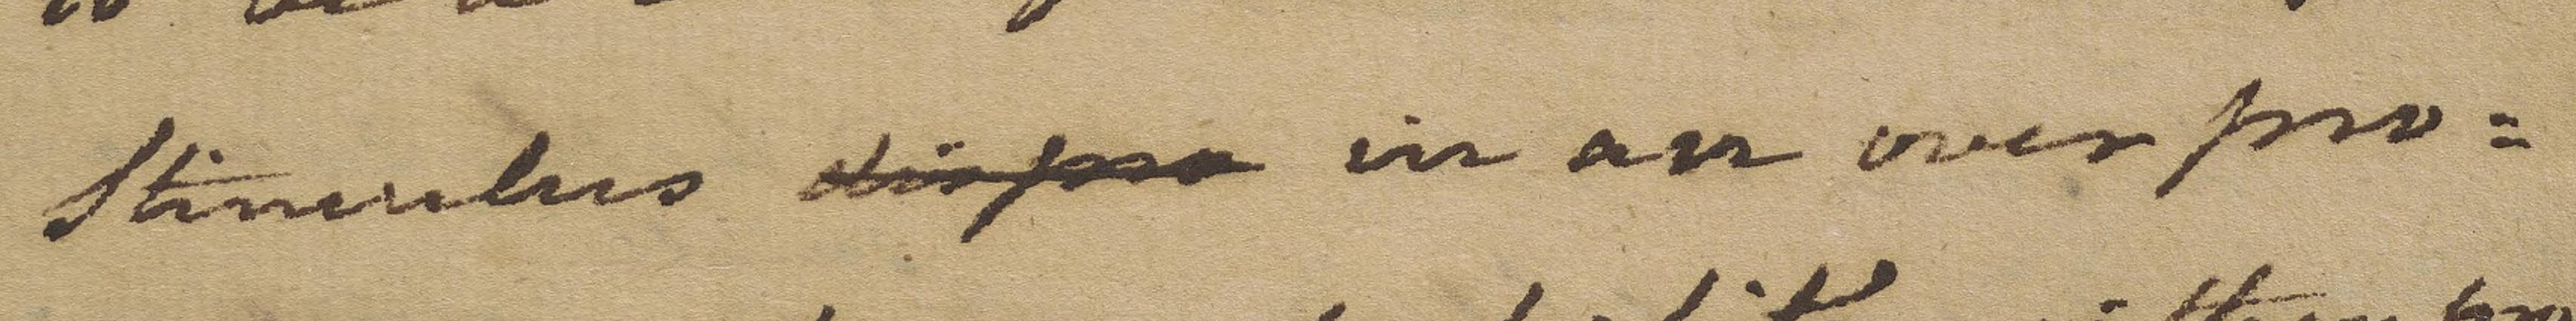stimulus [dispo] is an over pro-
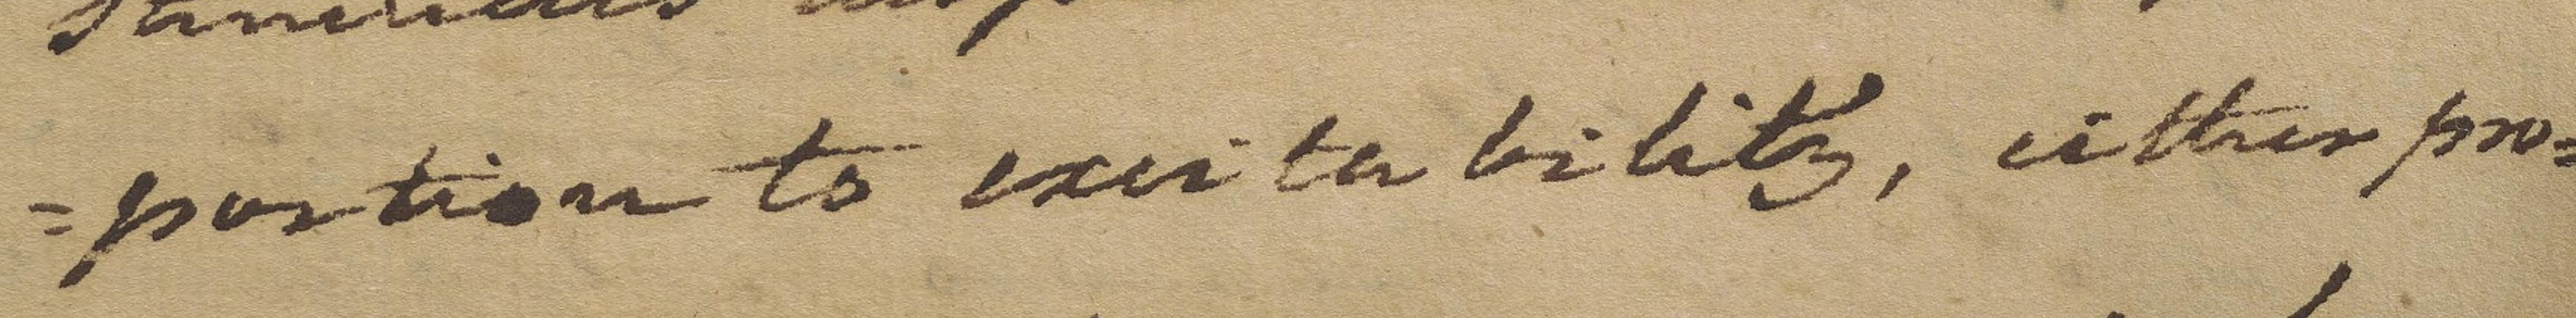-portion to excitability, either pro-
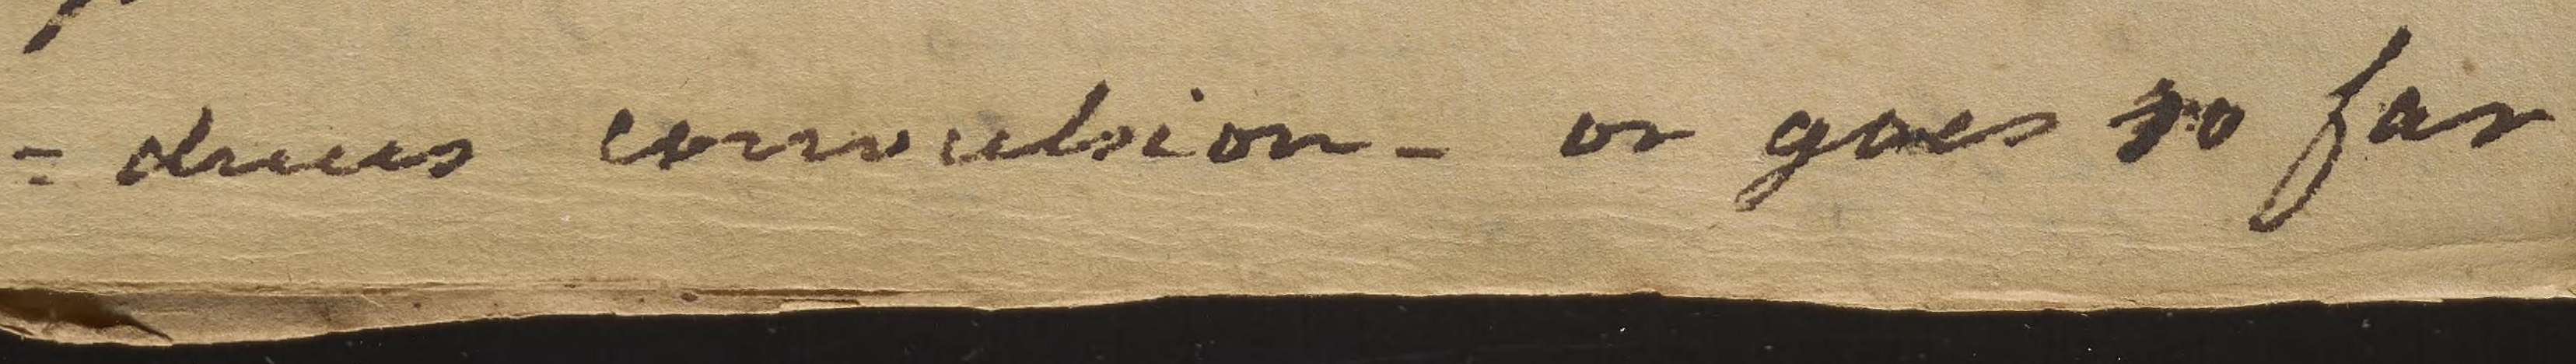-duces convulsion, or goes so far
